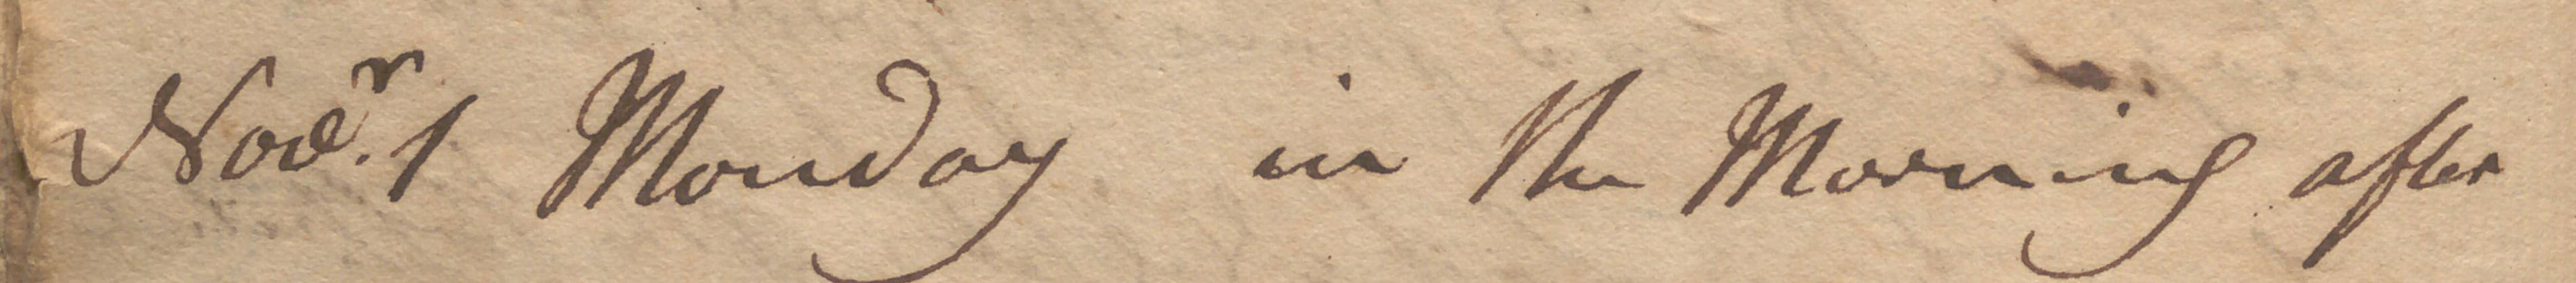Nov^r. 1 Monday in the Morning after
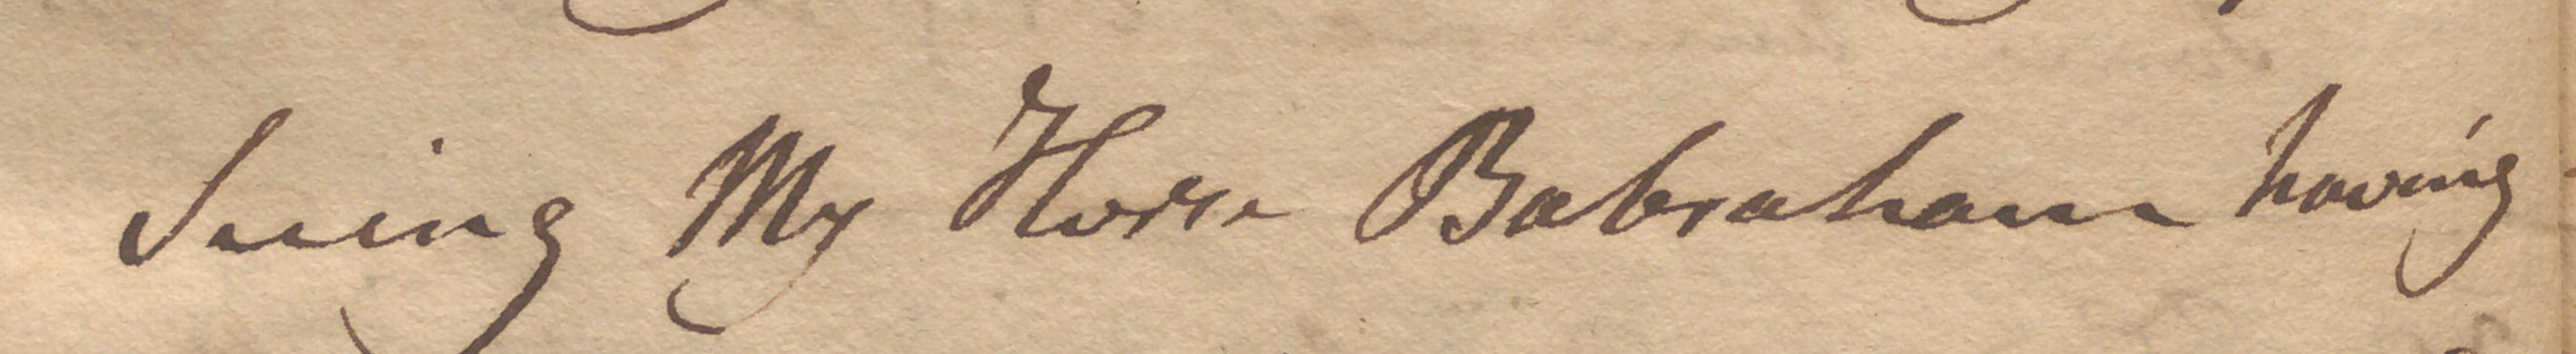seeing My Horse Babrahan having
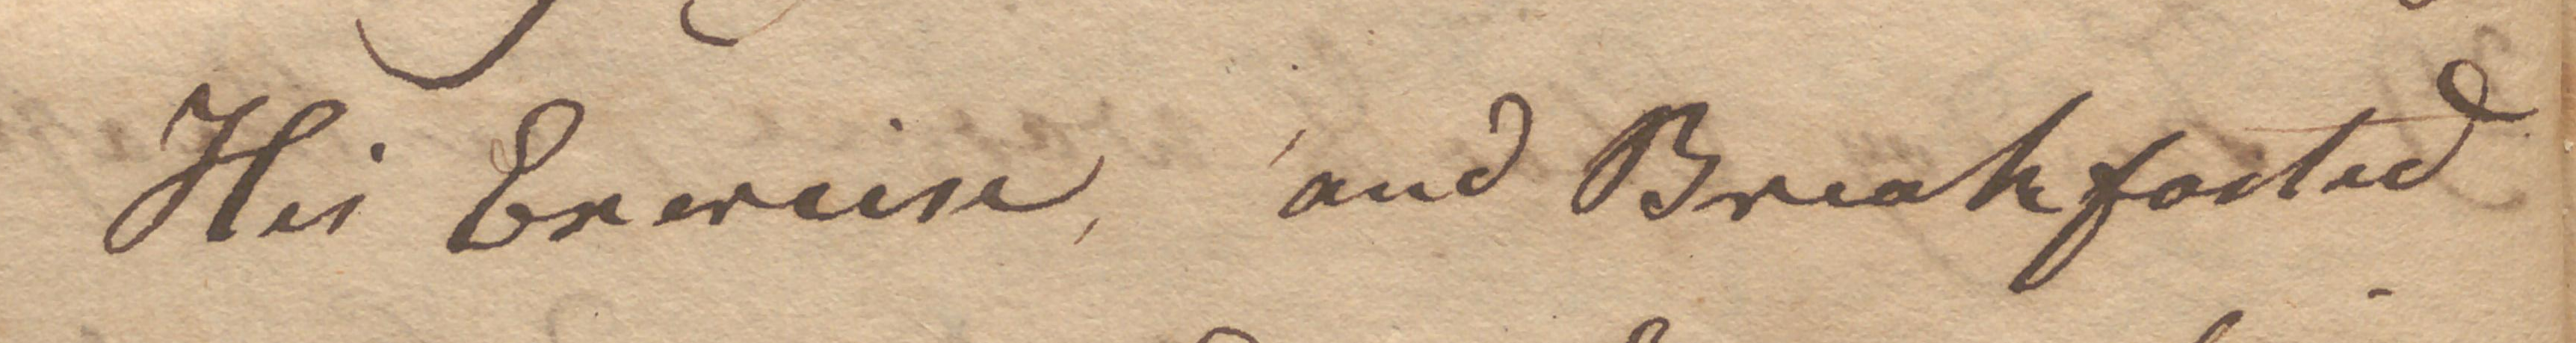His Exercise, and Breakfasted
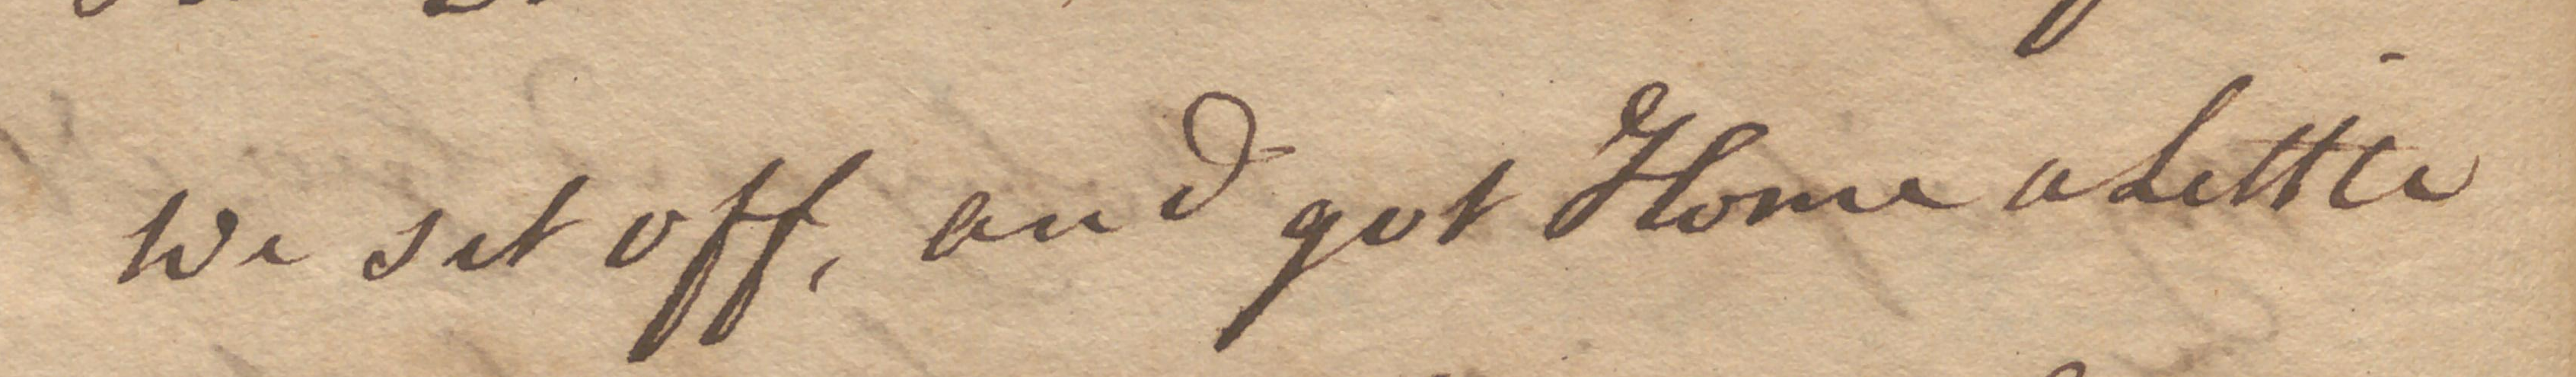we set off, and got Home a Little
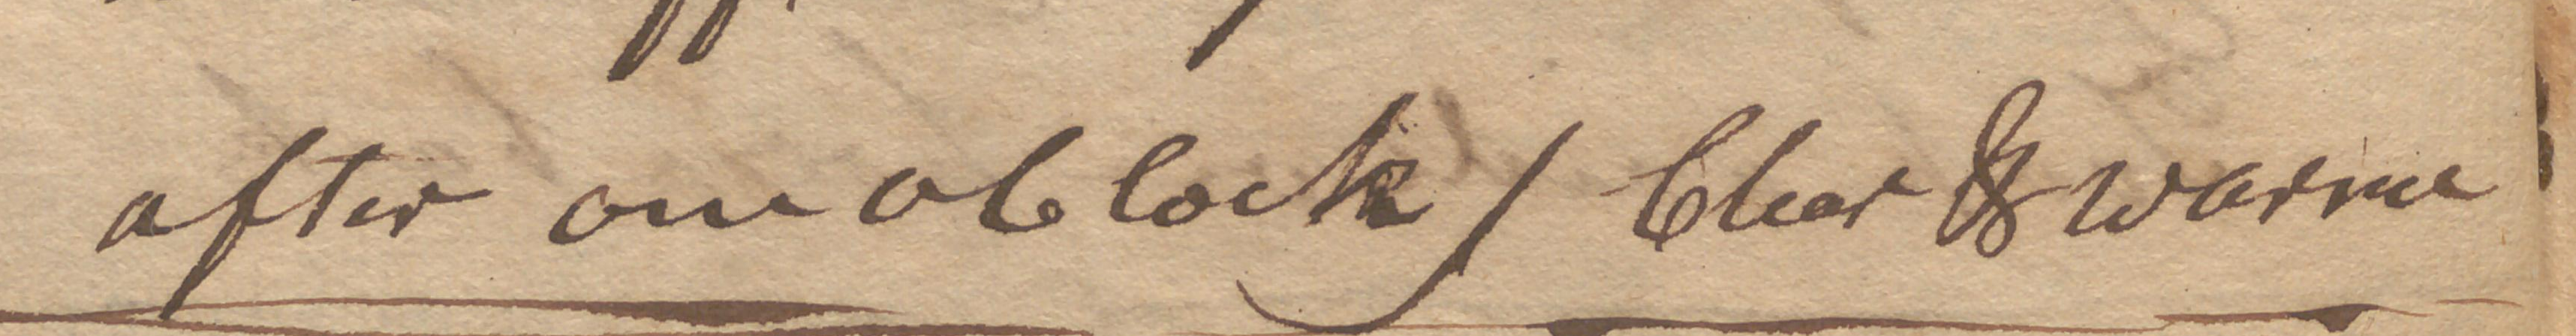after one oClock / Clear & warme
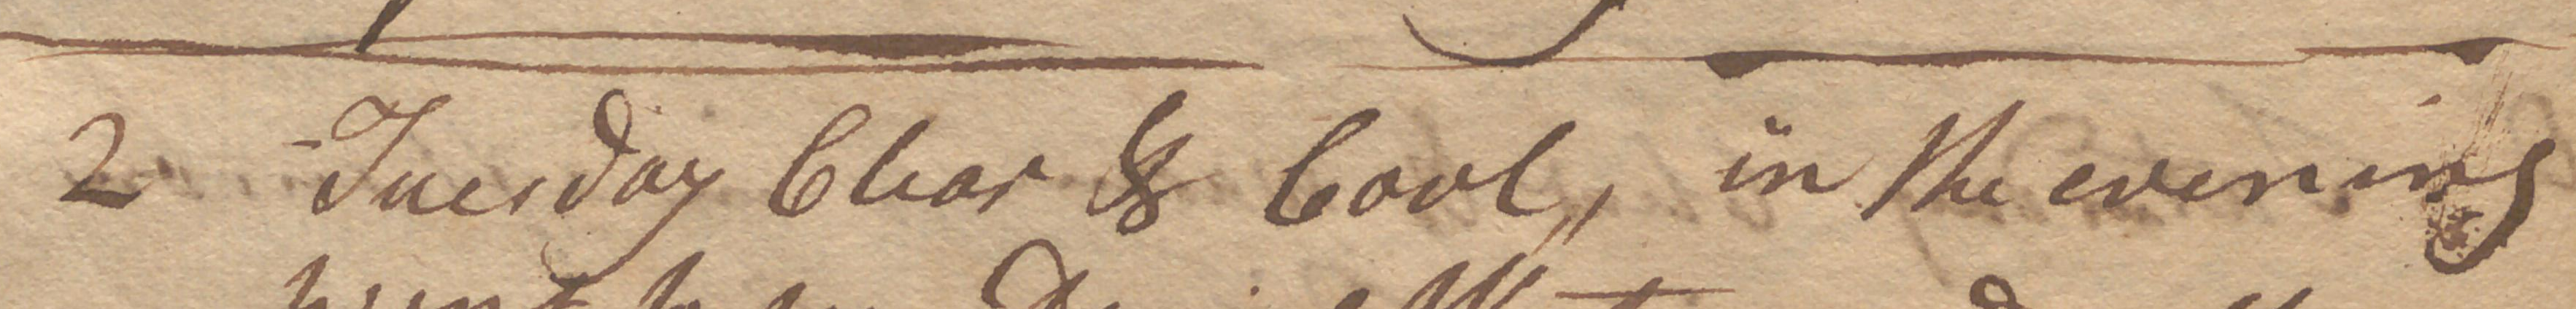2 Tuesday Clear & Cool, in the evening
